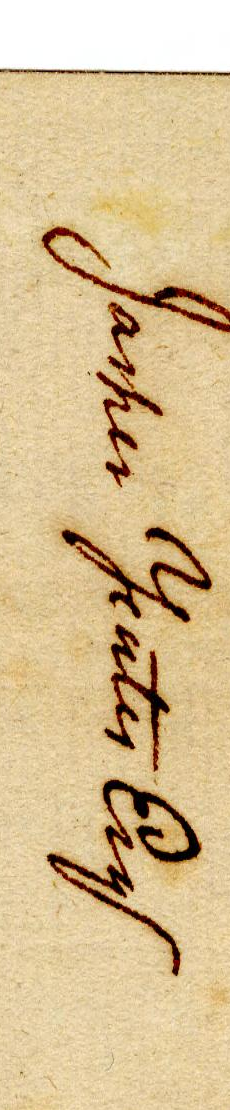Jasper Yeates Esq^r
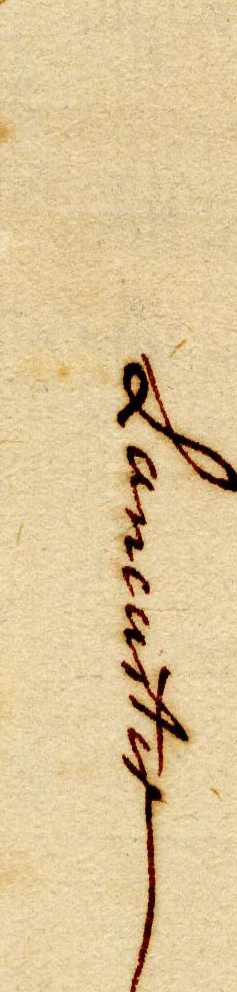Lancaster
